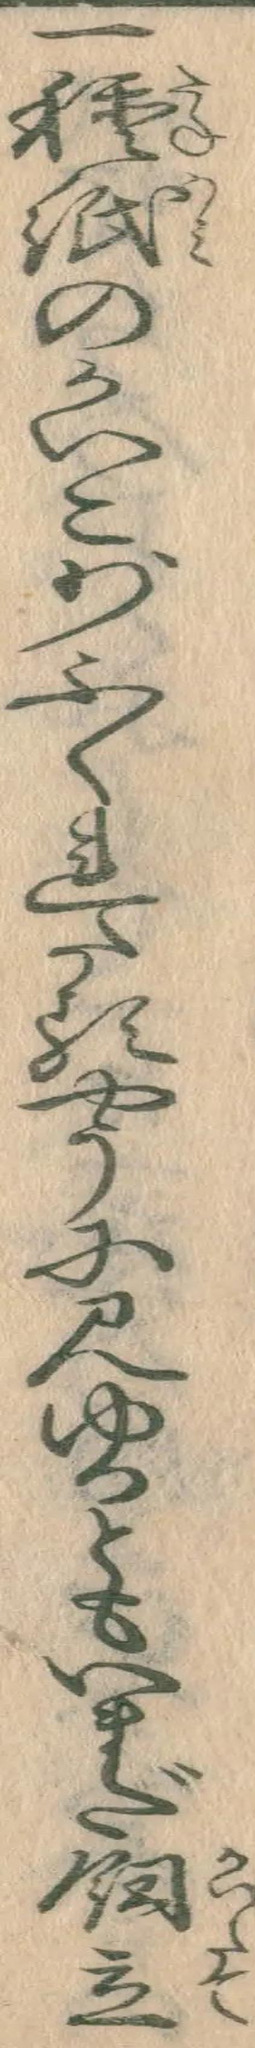一種紙のかいこ少ふくれたるやうに見ゆるともいまだ飼立
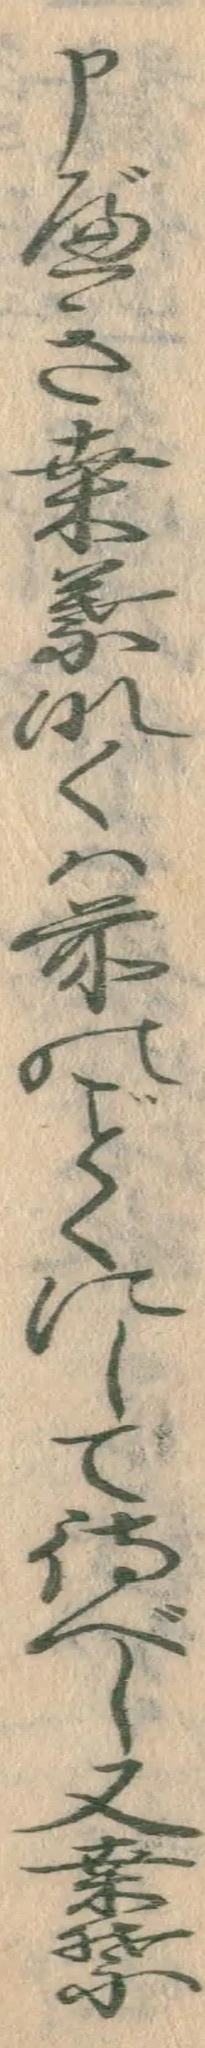申べき桑葉なくは前のごとくにして待べし又桑葉
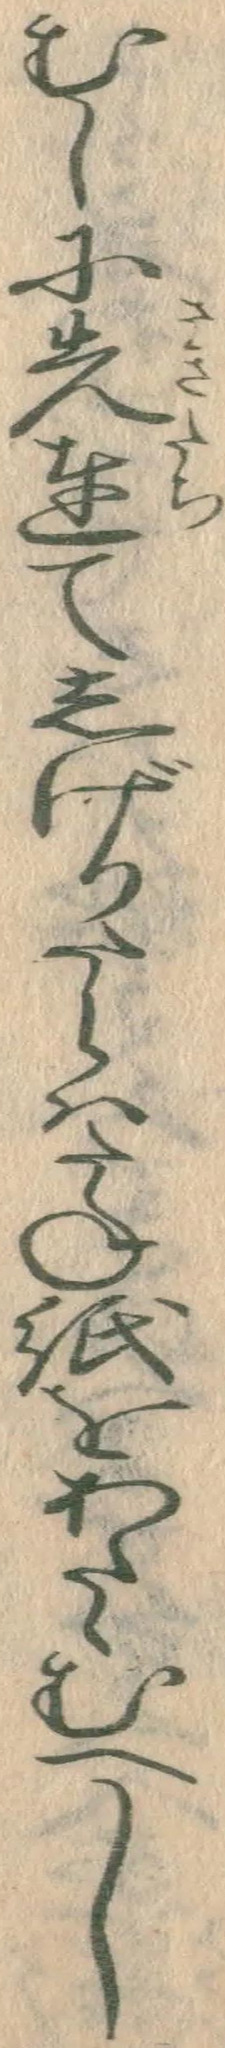むしに先達てしげりたらはたね紙をあたゝむへし
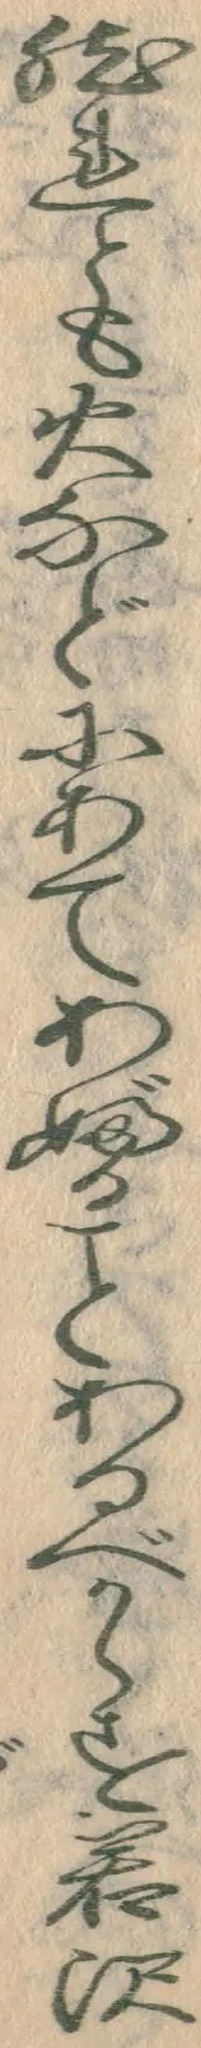然れとも火などにあてあぶることあるべからす若沢
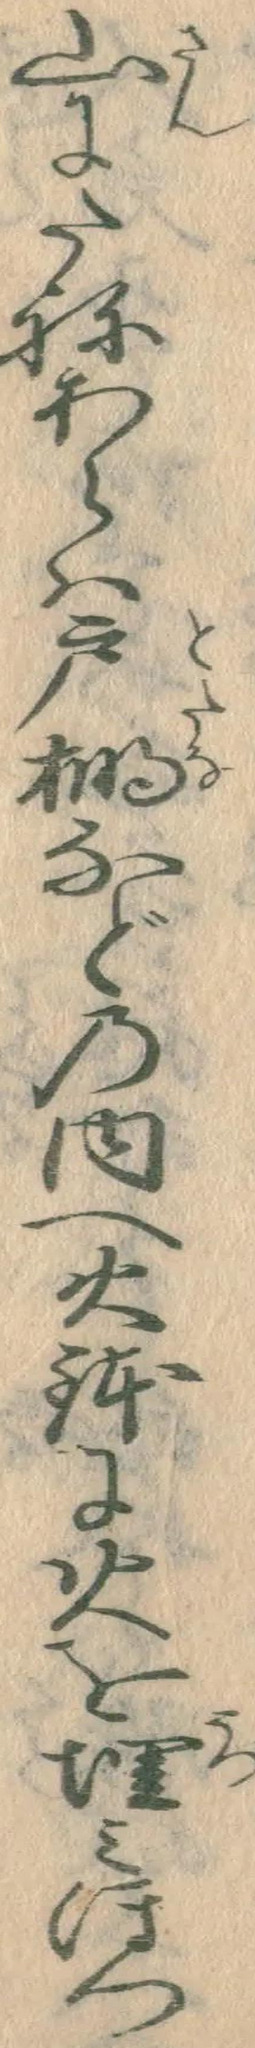山にたねあらは戸棚などの内へ火鉢に火を埋みほつ
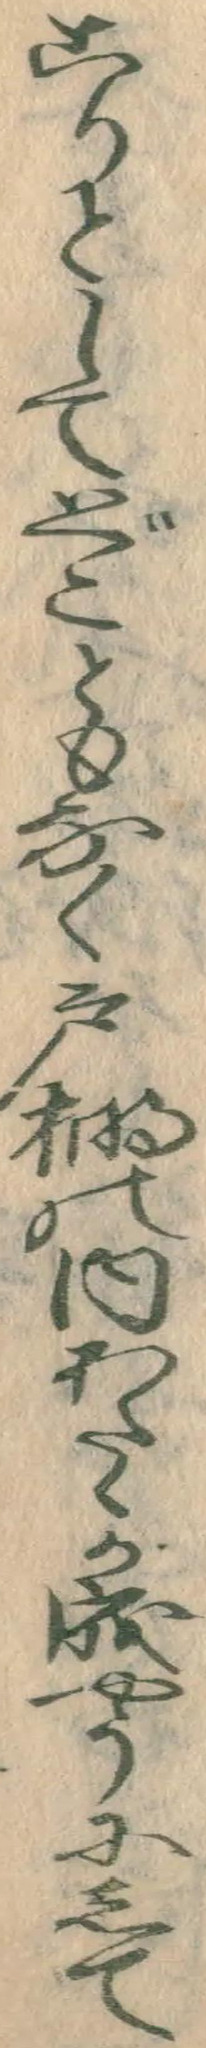こりとしていづこともなく戸棚の内あたゝか成やうにして
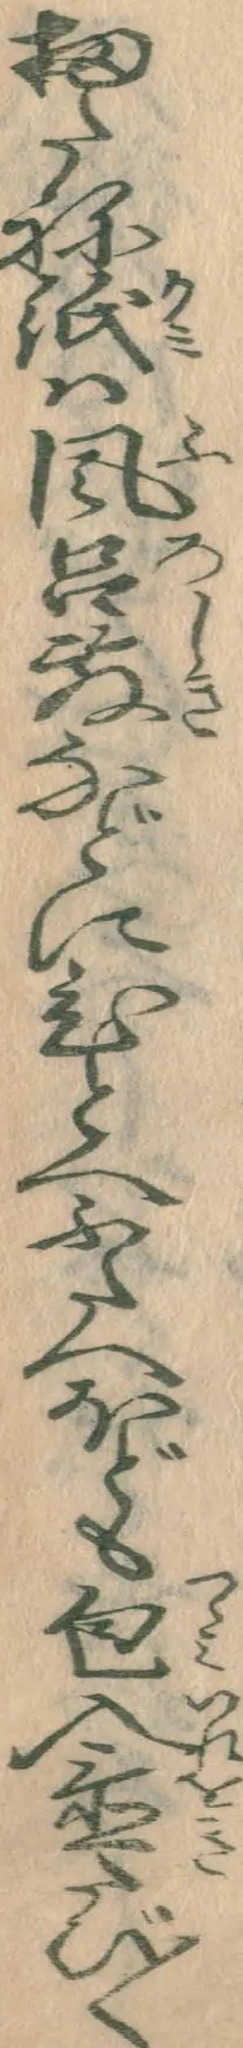扨たね紙は風呂敷などにひとへふたへほども包入置たび〳〵

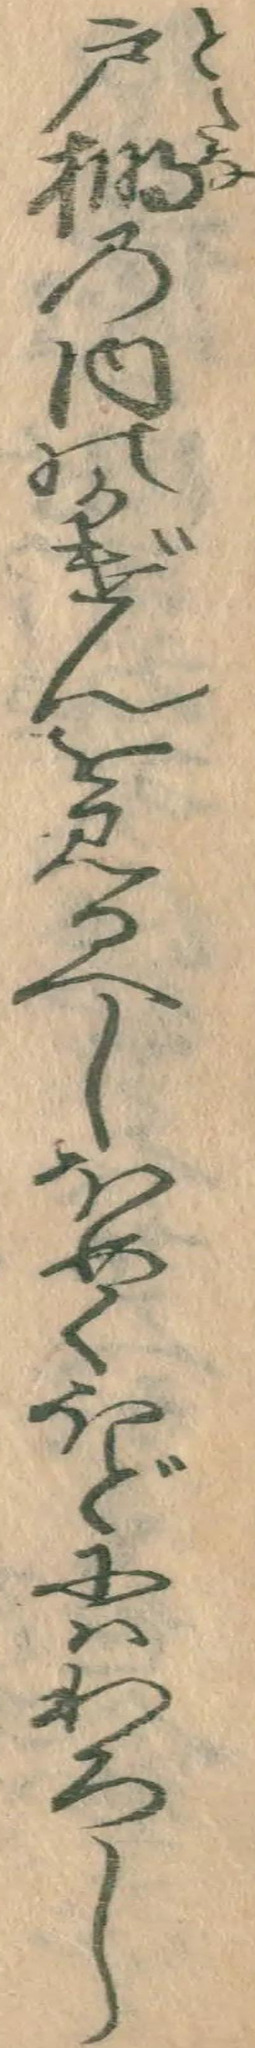戸棚の内のかげんを見るへしほめくほどにはわろし
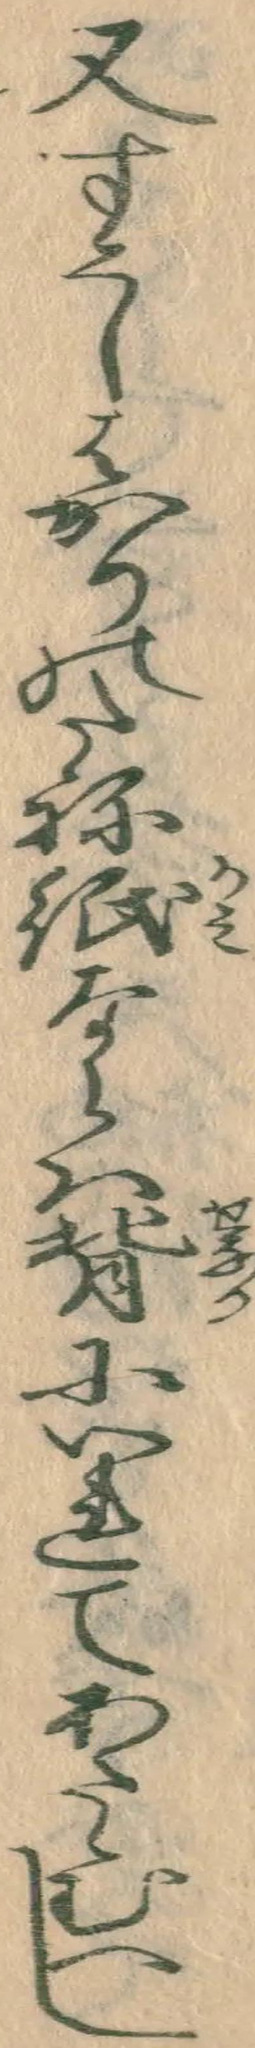又すこしはかりのたね紙ならは背にいれてあたゝむへし
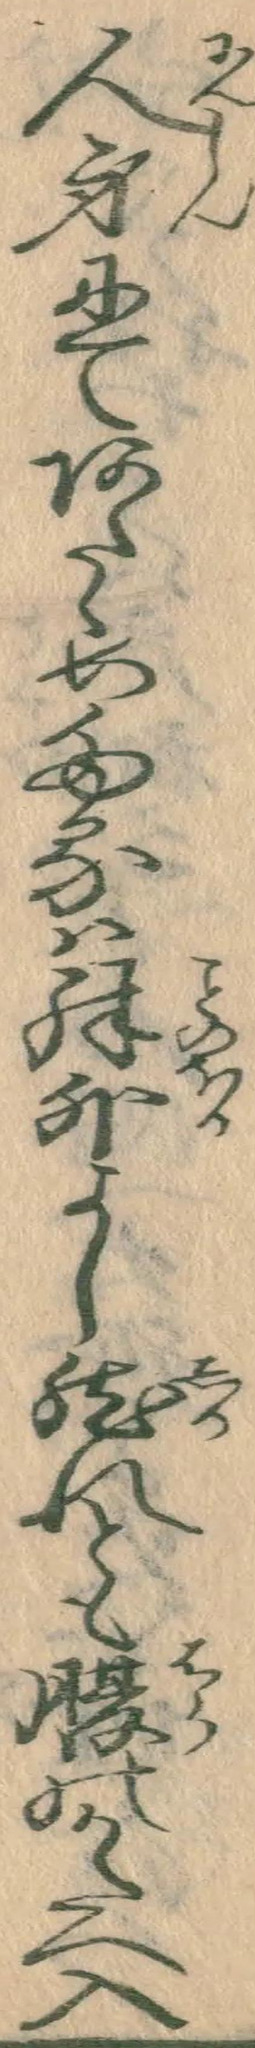人身にてあたゝめたるは殊外よし然れとも腹のかたへ入
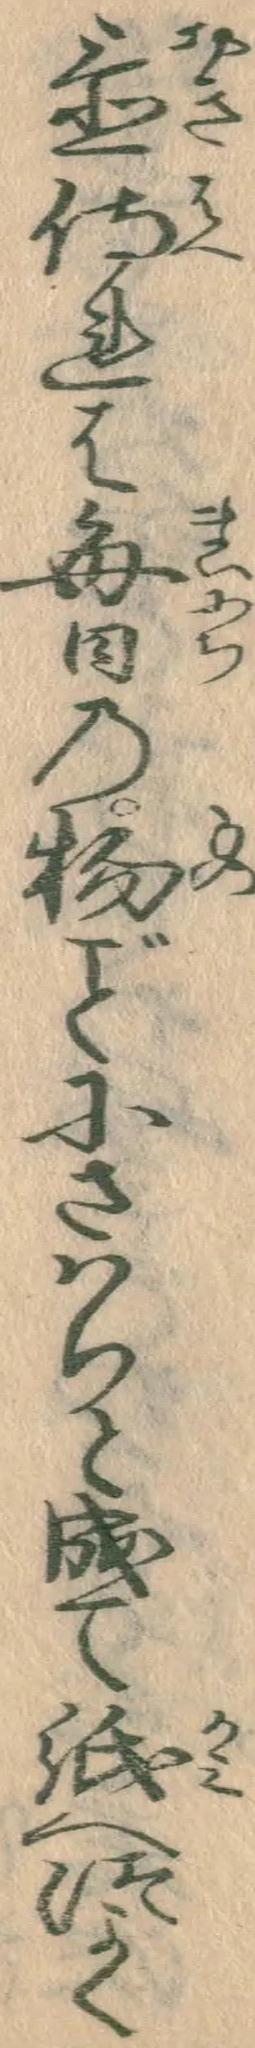置侍れは毎日の物ごとにさはりと成て紙へつよく
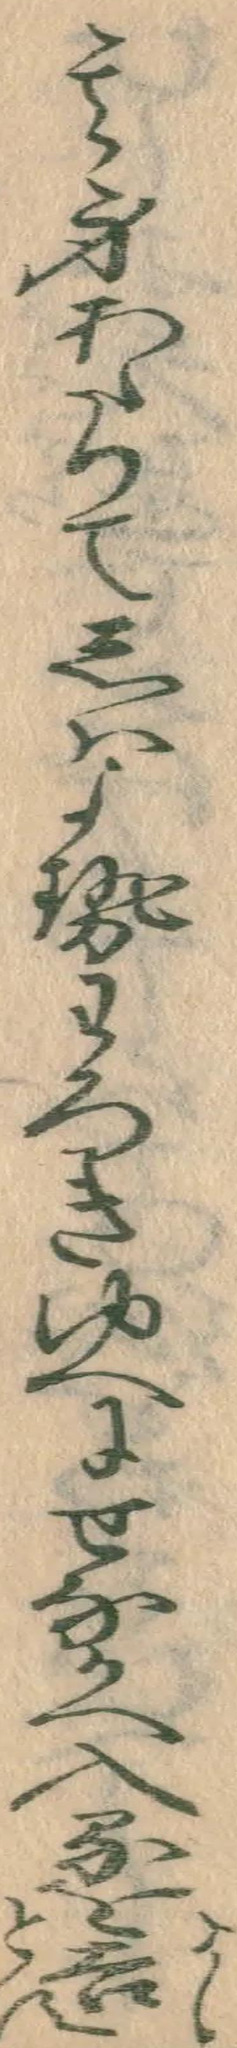其身あたりてしはよせわろきゆへにせなかへ入るを吉とす
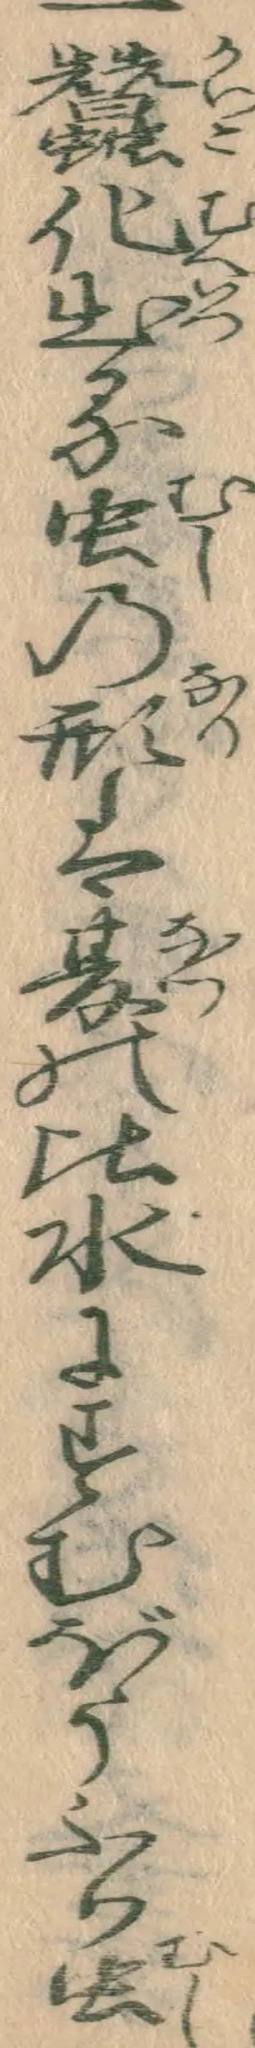一蚕化出る虫の形は夏の比水にすむぼうふり虫
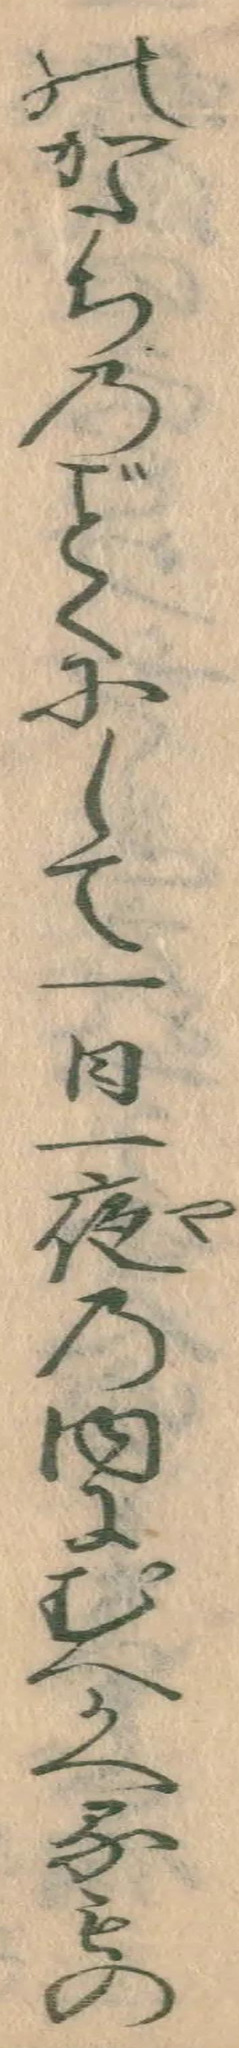のかたちのごとくにして一日一夜の内にむへかへるもの
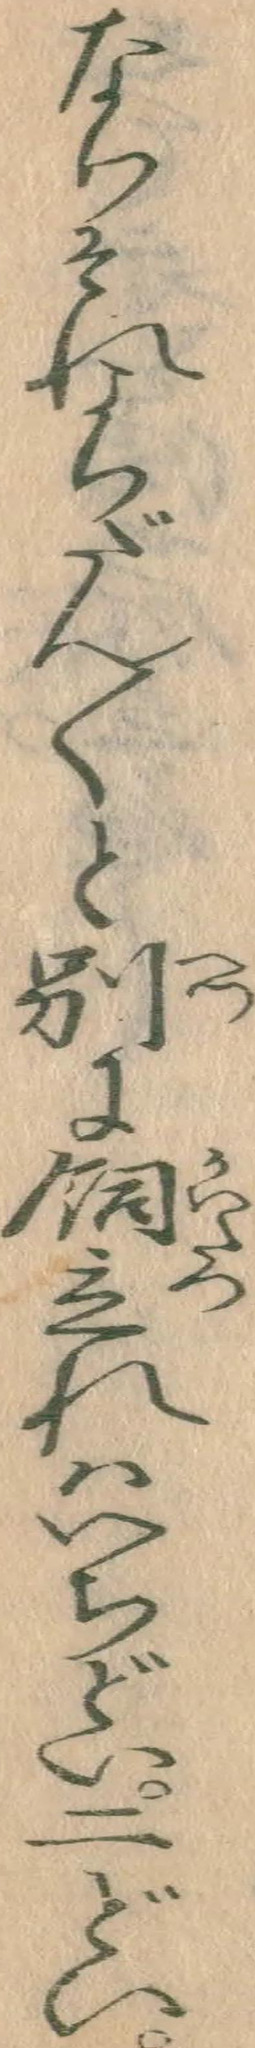なりそれよりだん〳〵と別に飼立れはいちどい。二どい。
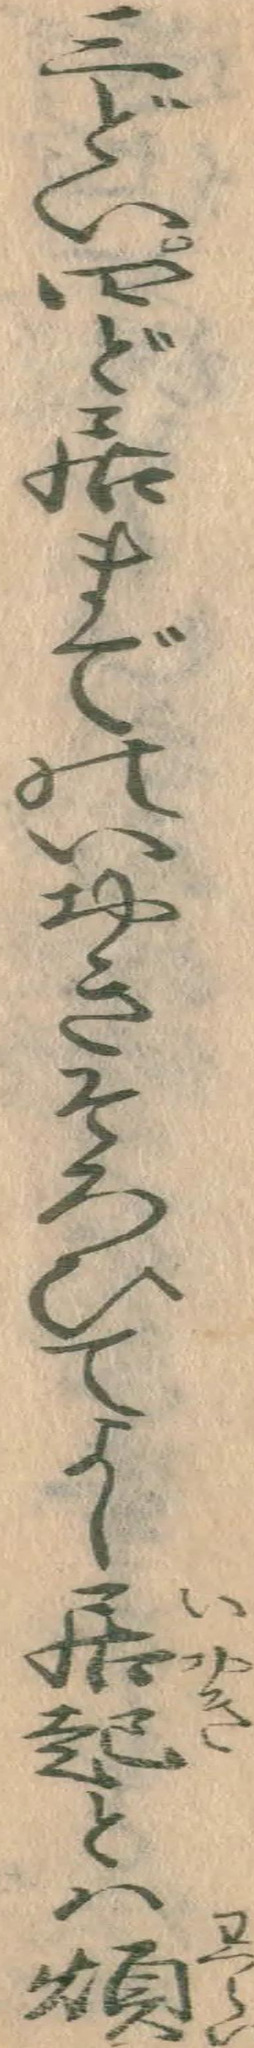三どい。四ど居までのいおきそろひてよし居起とは煩
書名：蚕飼養法記
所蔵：国立国会図書館 National Diet Library, JAPAN
